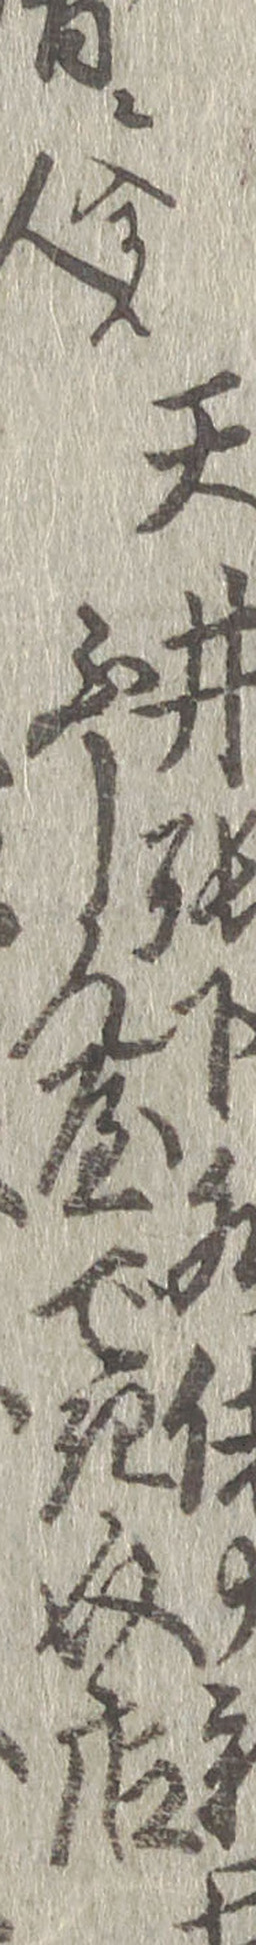ふしん屋でき介店
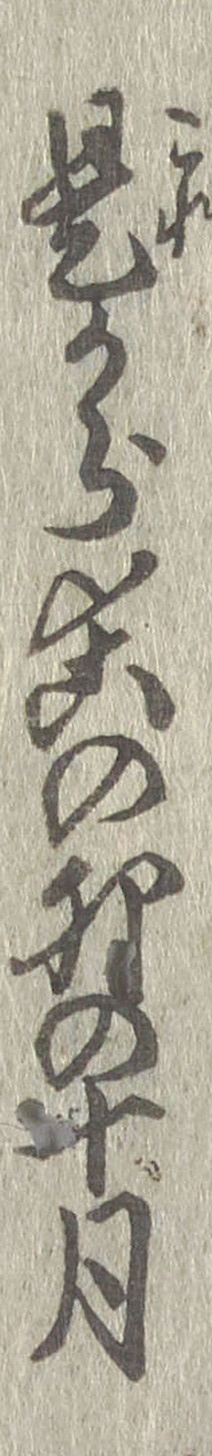是から〆この夘の十月
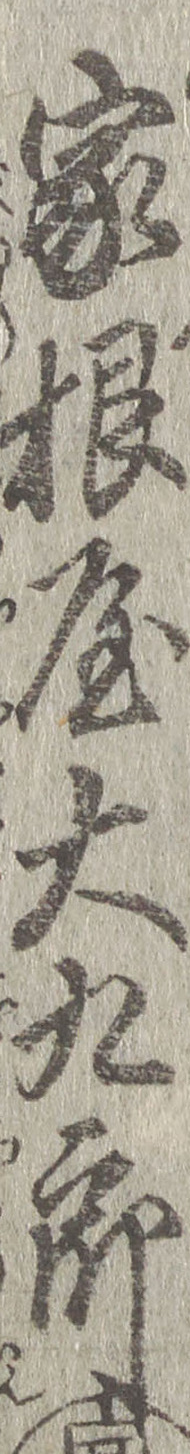家根屋大九郎○
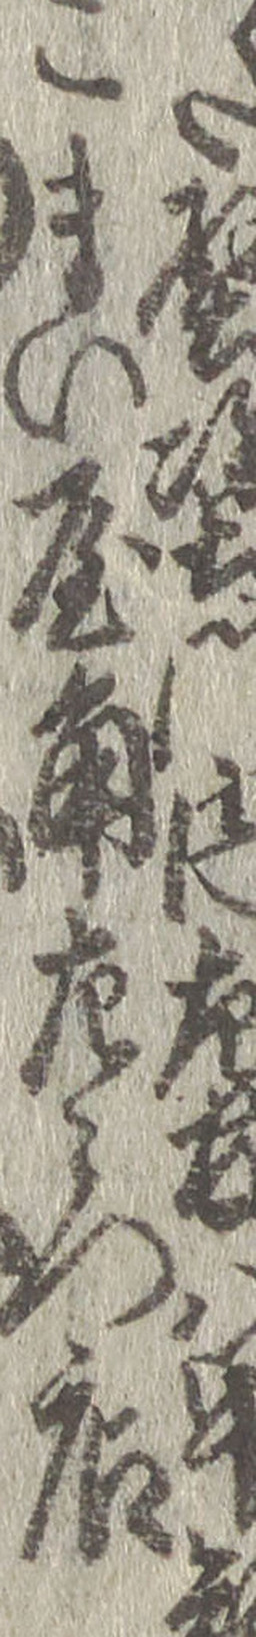こまい屋角左衛門店
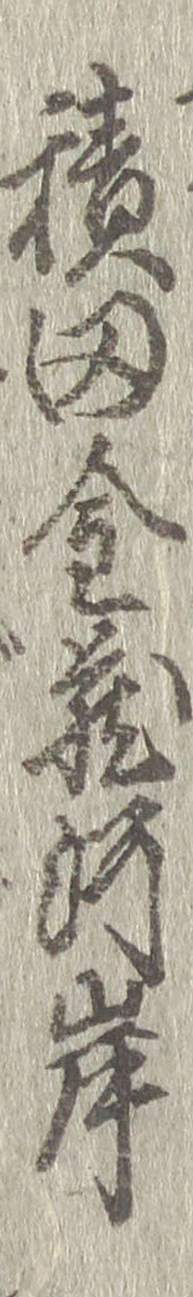積田金蔵河岸
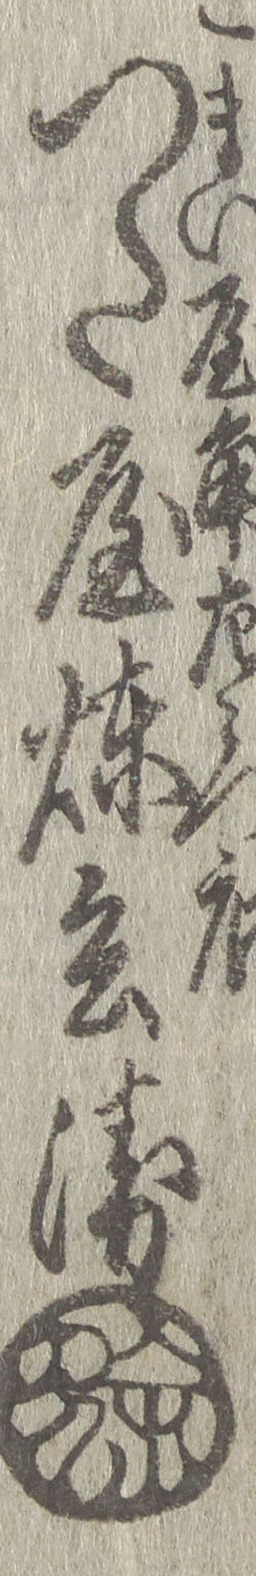つた屋煉兵衛○
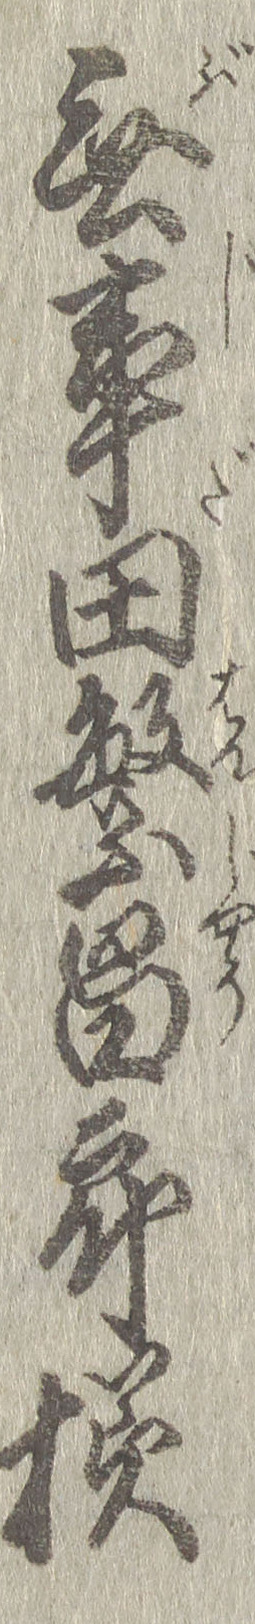無事田繁昌郎様
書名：年魚瓢箪人浮状之事
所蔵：東京大学総合図書館 General Library in the University of Tokyo, JAPAN
